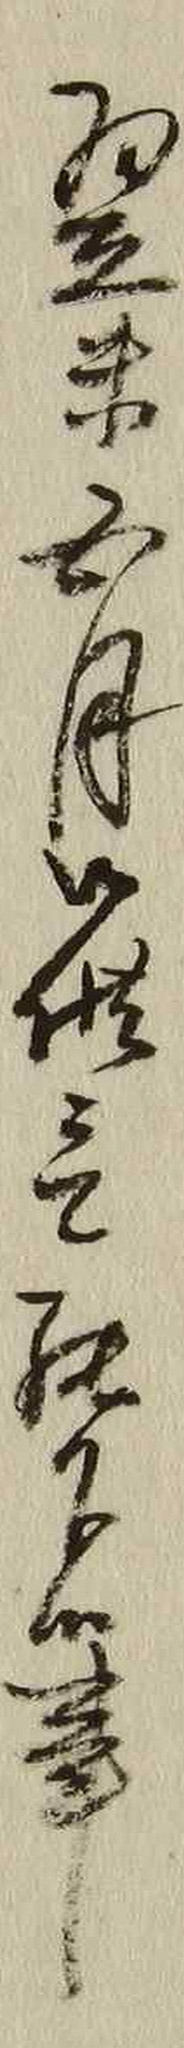翌未五月御供ニて罷下候事
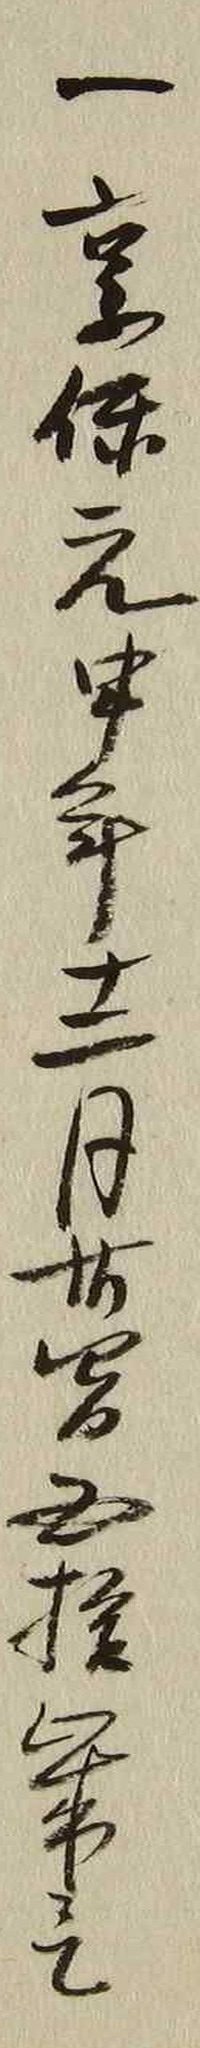一享保元申年十二月廿四日五拾歳箒ニて
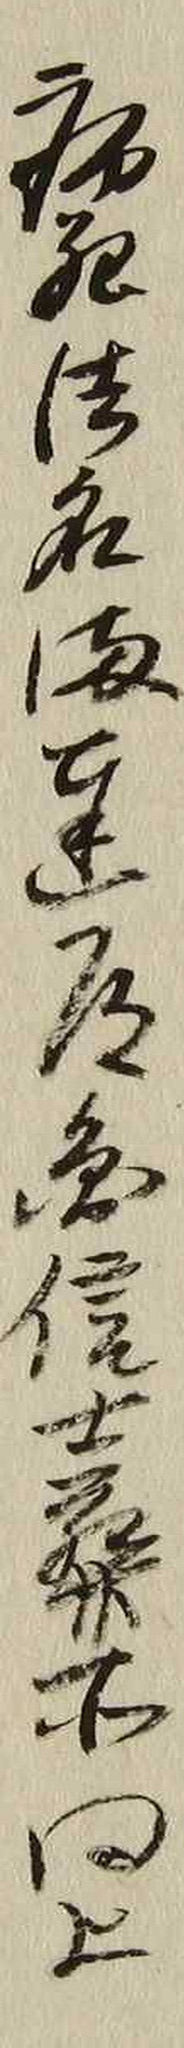病死法名満達道円信士葬所同上
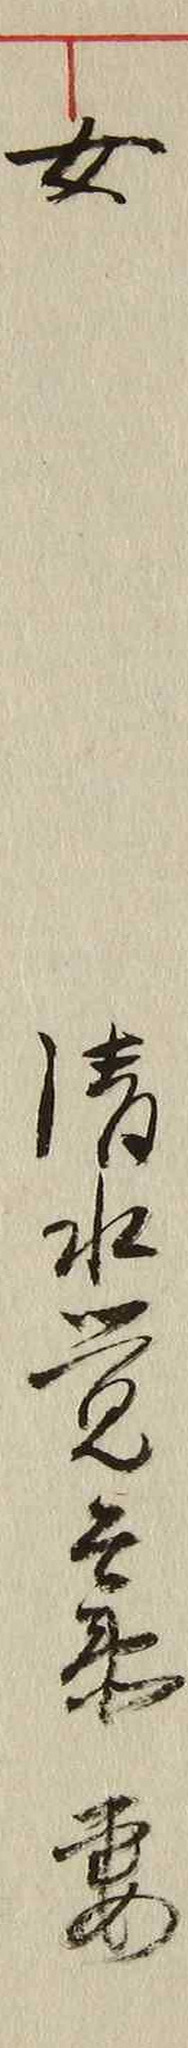女清水覚兵衛妻
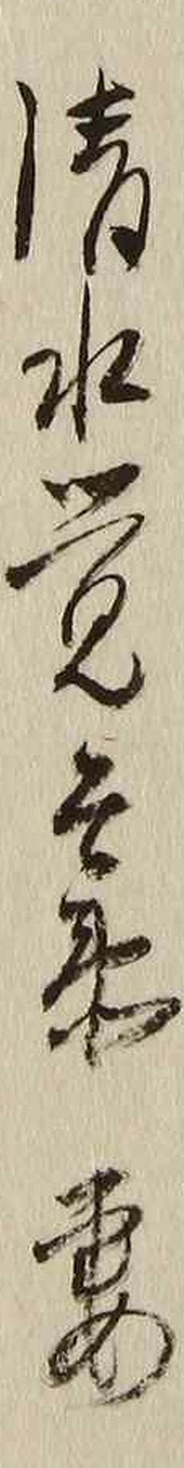女清水覚兵衛妻
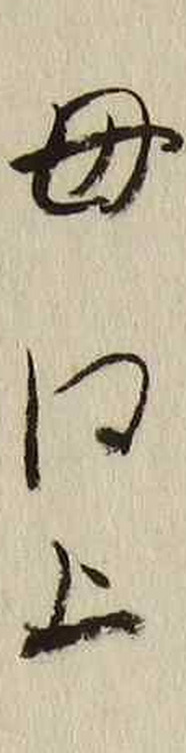母同上
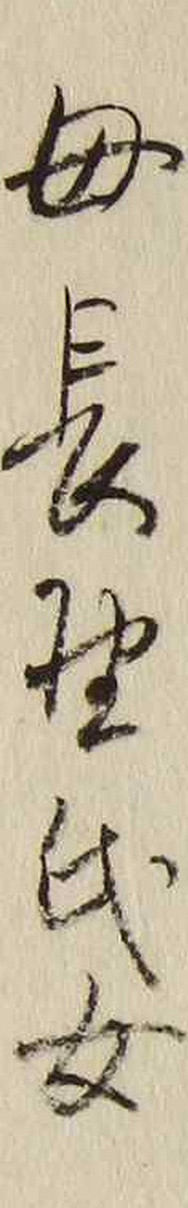母長野氏女

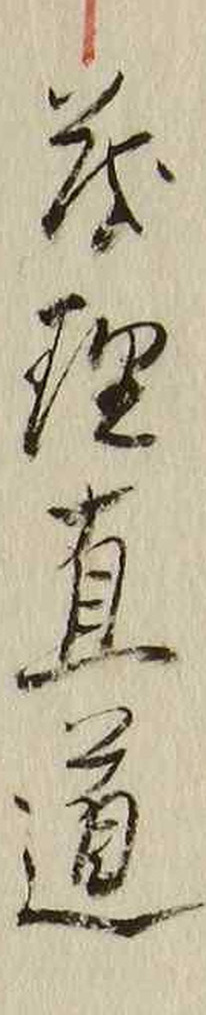茂理直道
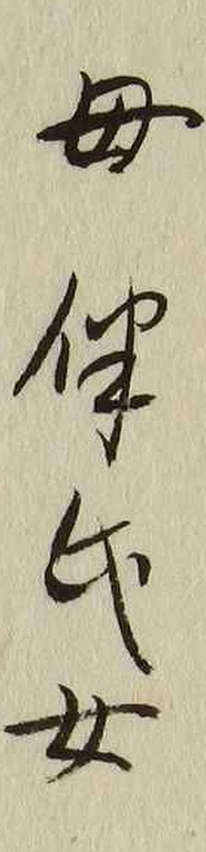母伴氏女
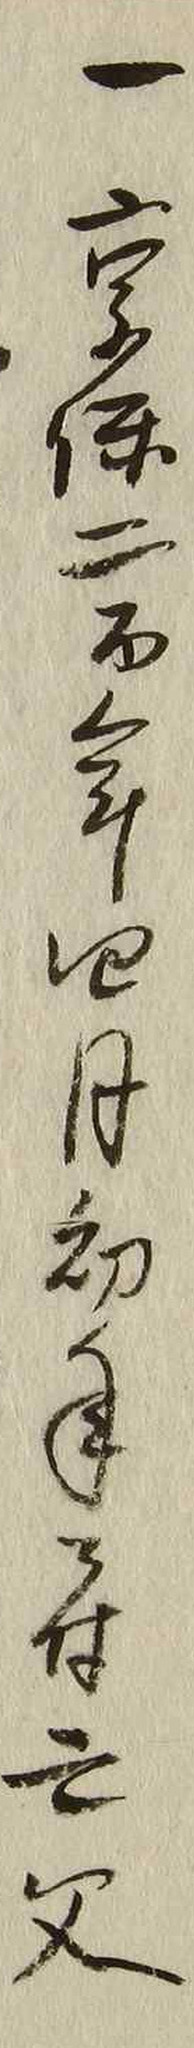一享保二酉年四月幼年ニ付亡父
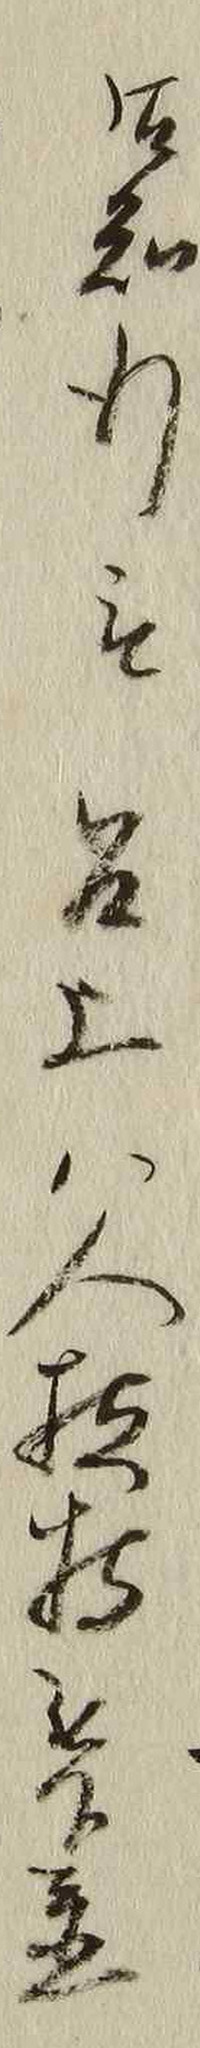御知行被召上八人扶持被下置
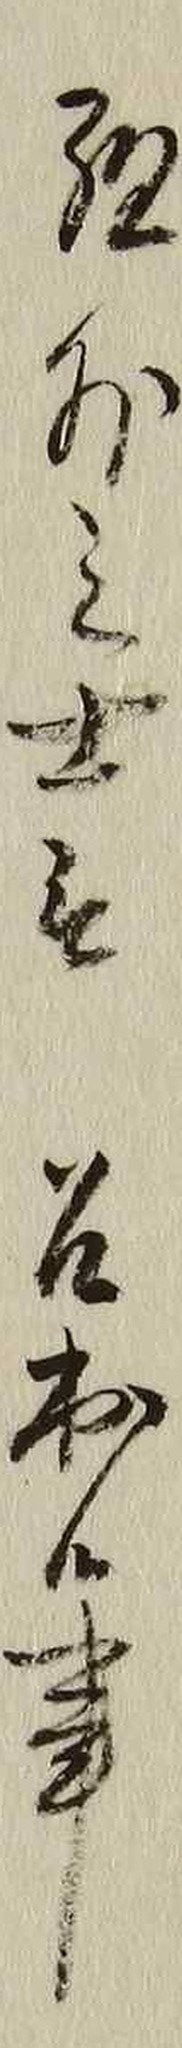組外之士被召出候事
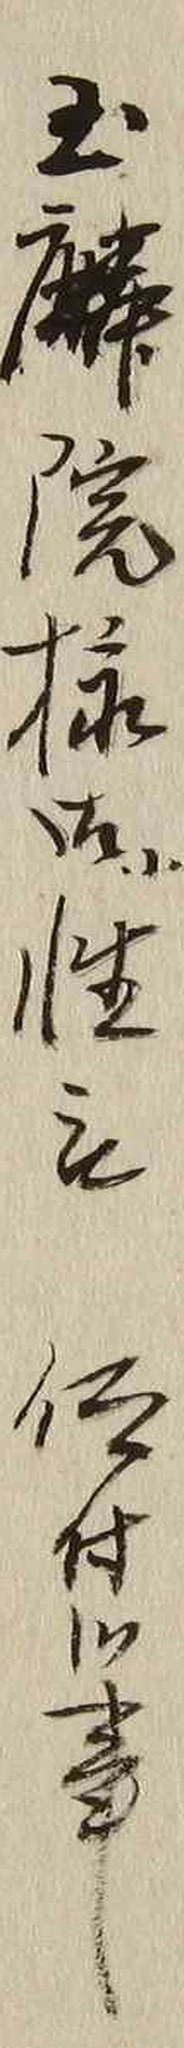玉麟院様御小性被仰付候事
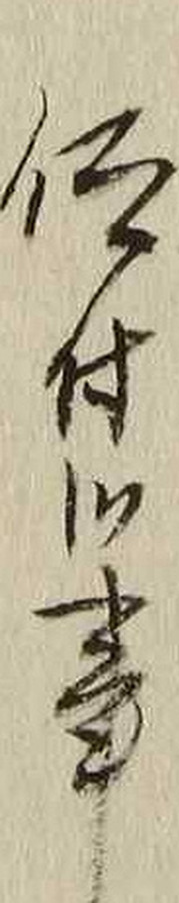仰付候事
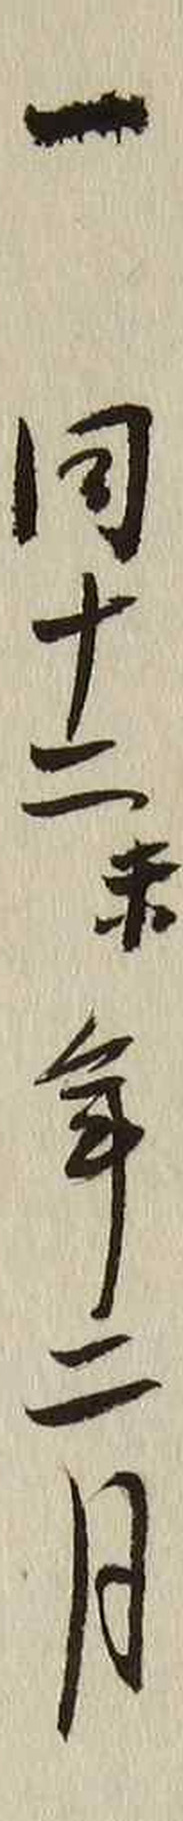一同十二未年二月
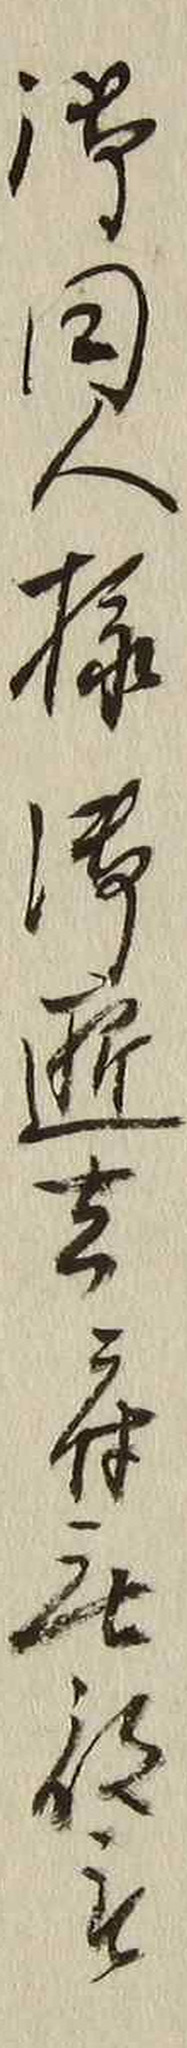御同人様御逝去ニ付無役被
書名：諸士系譜　巻之349　も之部5
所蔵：会津若松市立会津図書館
